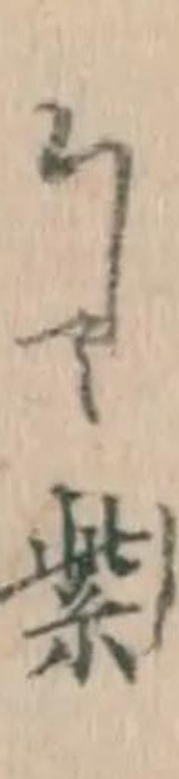くして紫
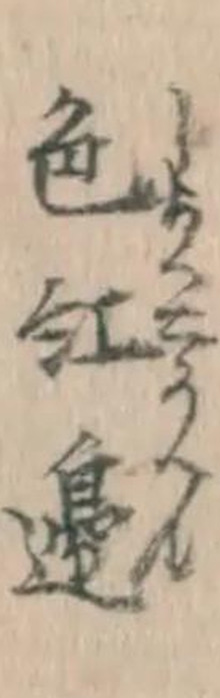色紅辺
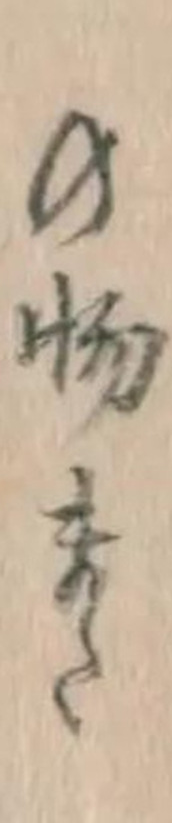の物また
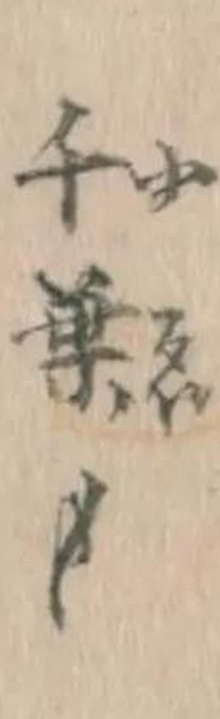千葉も

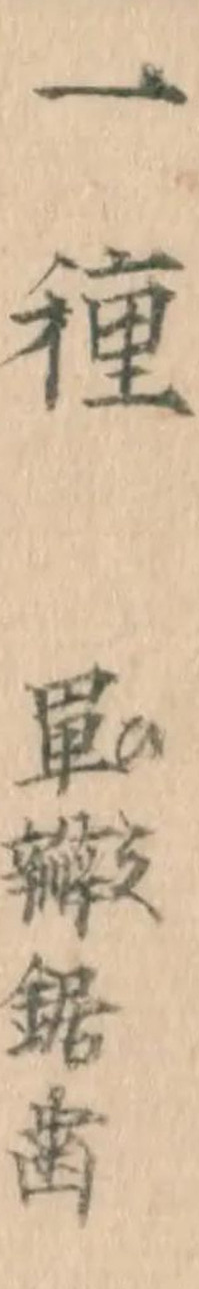一種単弁鋸歯
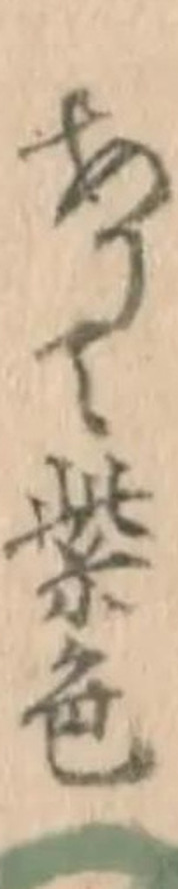ありて紫色
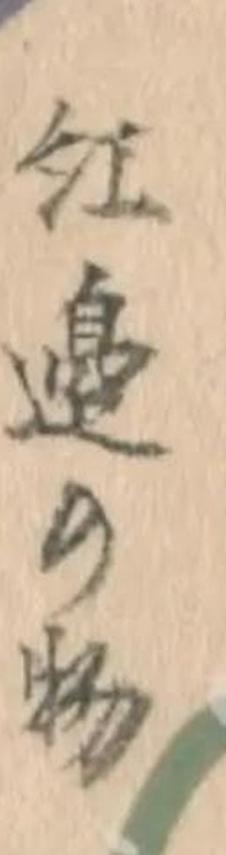紅辺の物
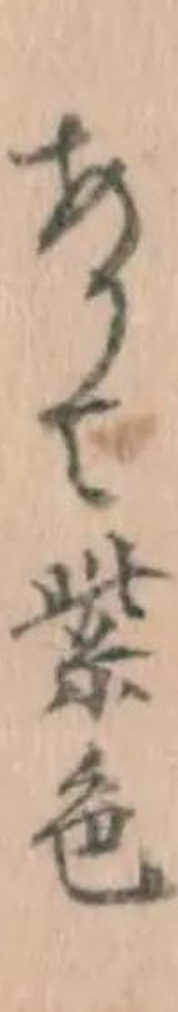ありて紫色
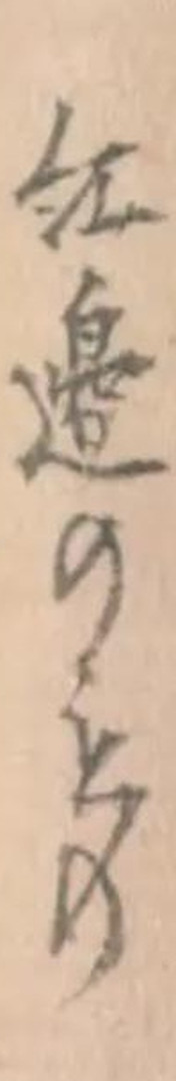紅辺のもの
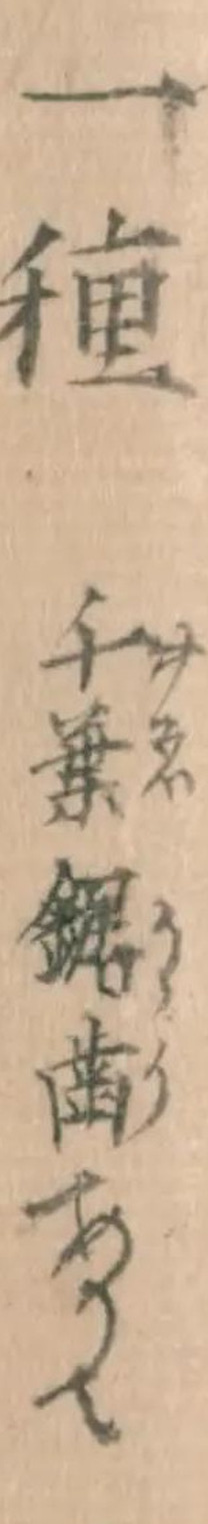一種千葉鋸歯ありて
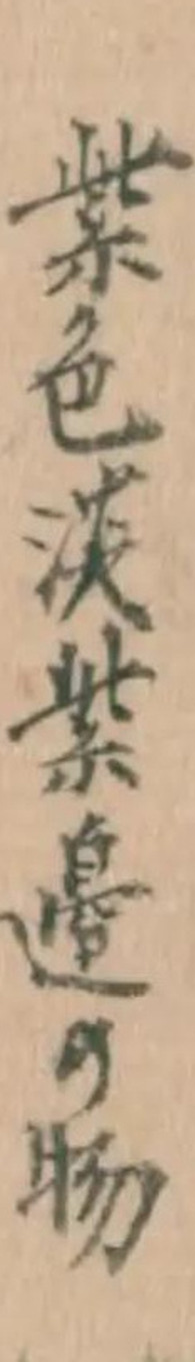紫色淡紫辺の物
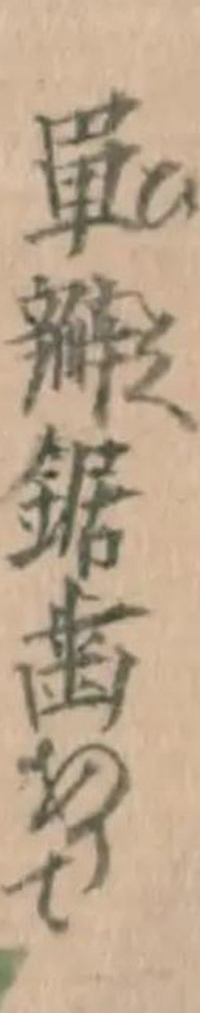単弁鋸歯ありて
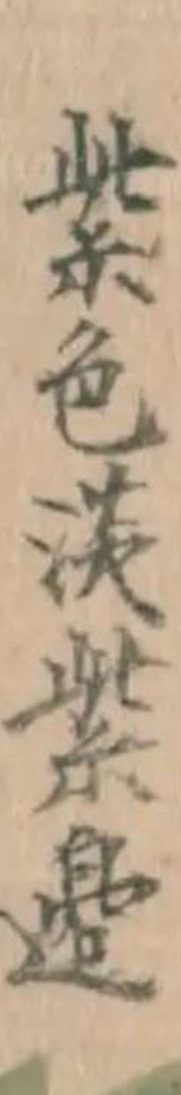紫色淡紫辺
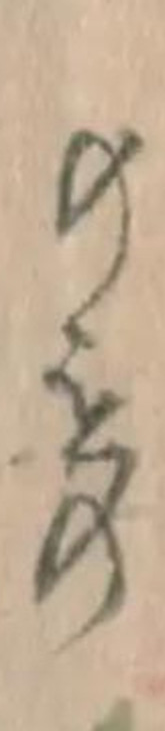のもの

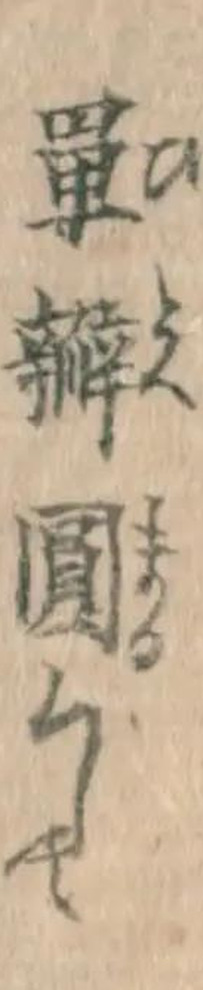単弁円くして
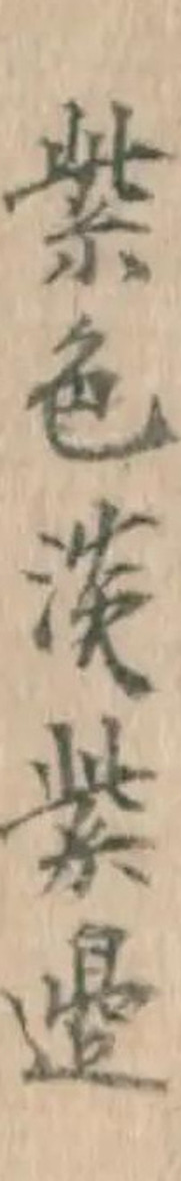紫色淡紫辺
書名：本草図譜. 巻40-42
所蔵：国立国会図書館 National Diet Library, JAPAN
